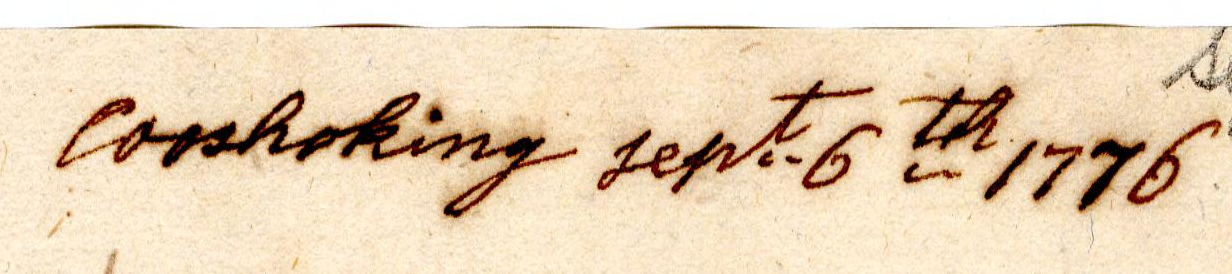Cooshoking sep^t. 6 ^th 1776
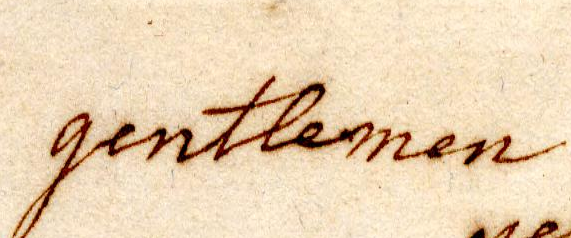gentlemen
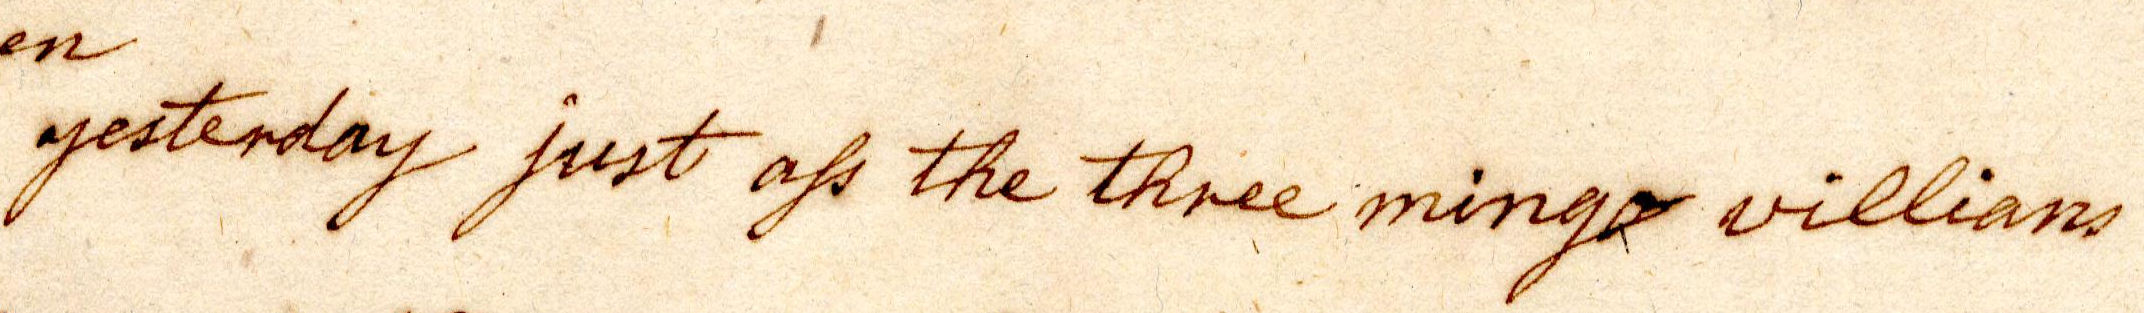yesterday just ass the three mingo villians
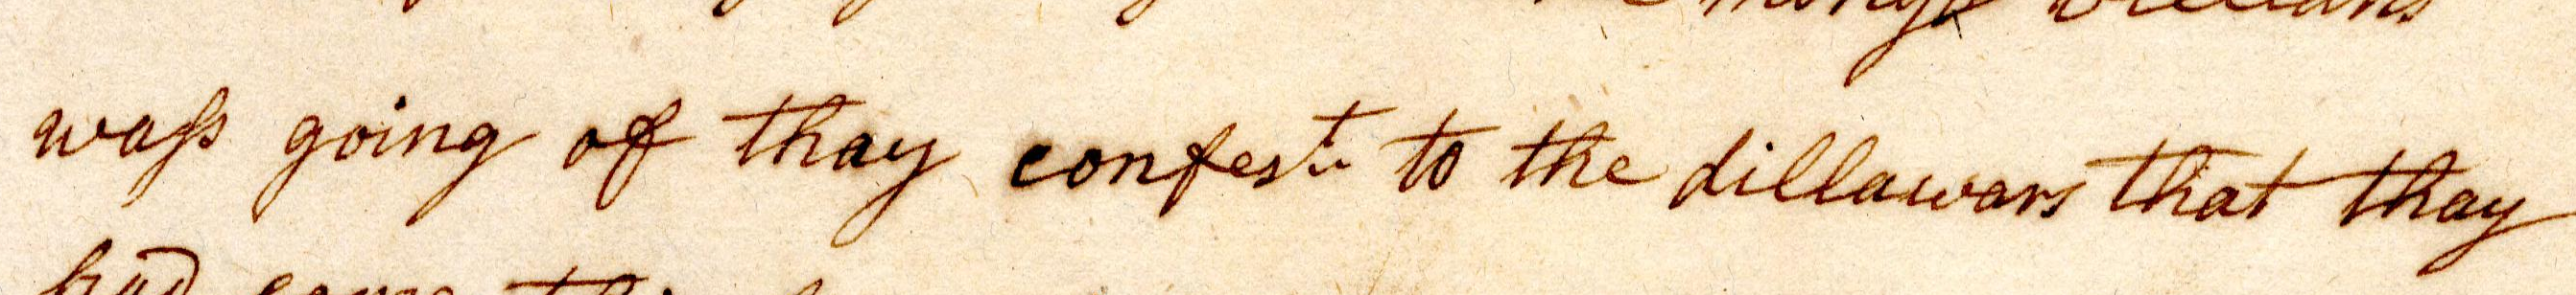wass going of thay confes^t to the dillawars that thay
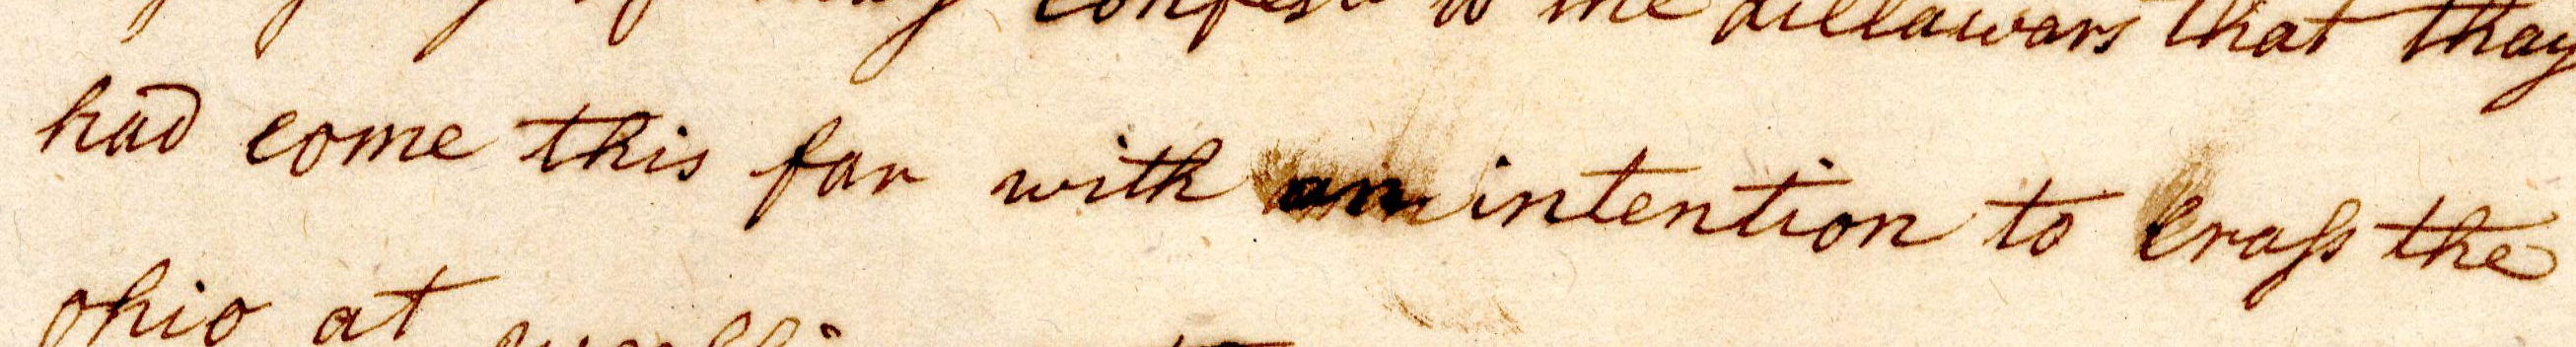had come this far with an intention to crass the
